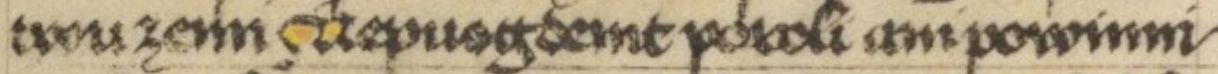twu zemi Nepuogdemt poroli am powinni
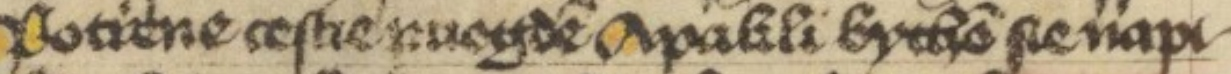Potṙene ceſtie puegdȇ Apakli bychȏ ſie napi-
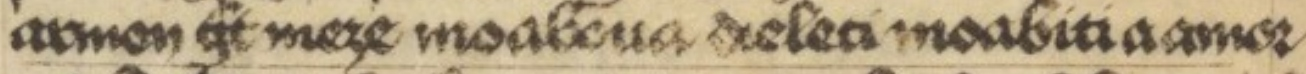armon g̑t meze moaboua deleti moabiti a amor-
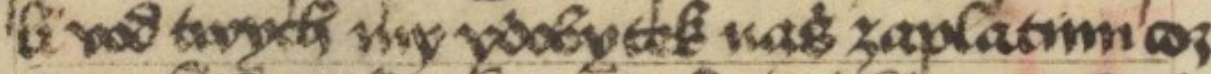li vod twych my ydobytek naṡ zaplatimi coz
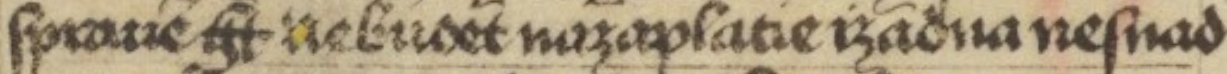ſprauȇ g̑t Nebudet nazaplatie rzadna neſnad-
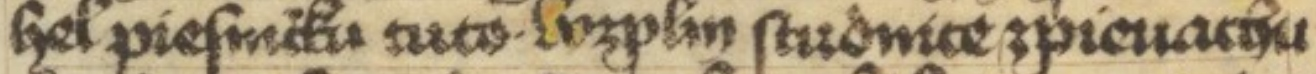hel pieſniċku tuto Wzplin ſtudnice zpieuachu
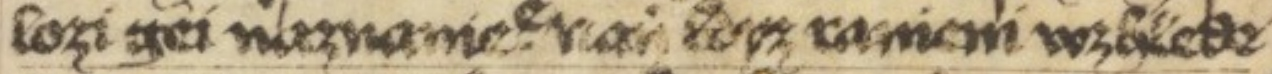lozi gei naznanie.e naṅ kdyz ranieni wzhlede-
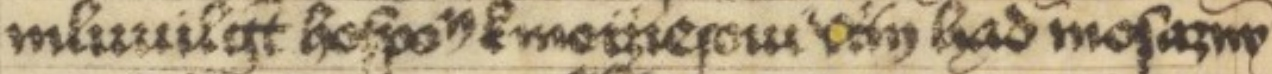mluuil g̑t hoſpon k moiżieſoui Vċin had moſazny
